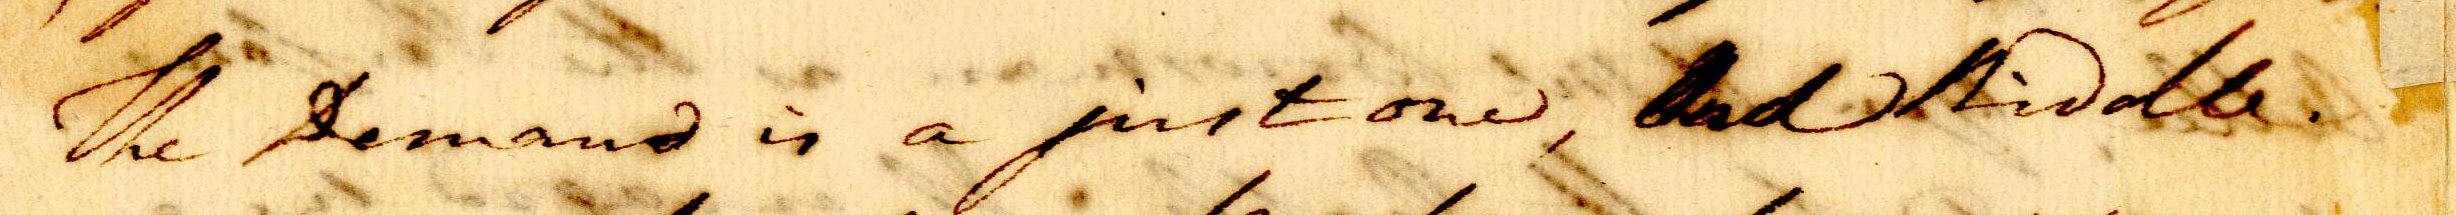The Demand is a just one, but Biddle
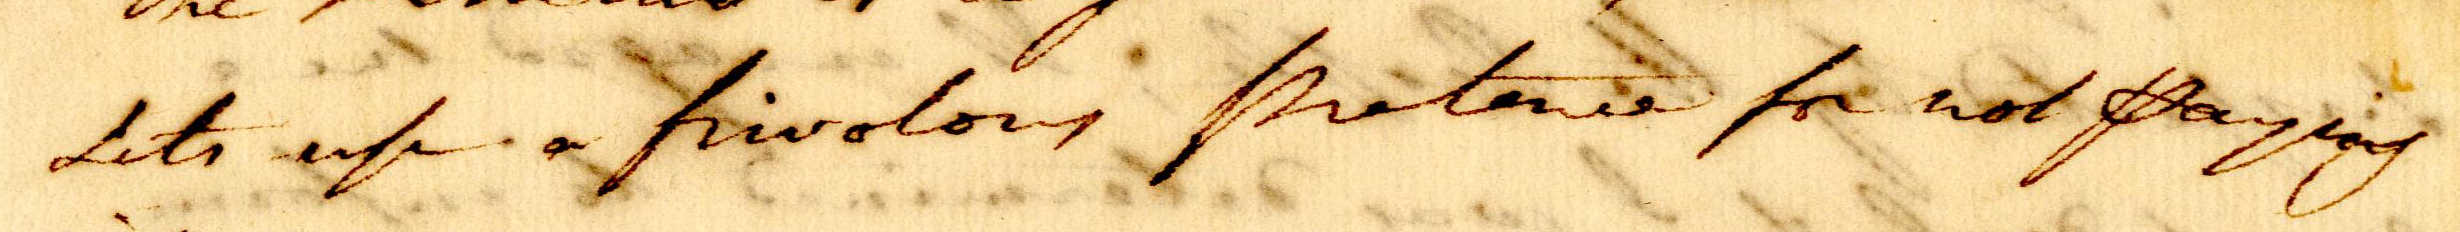Lets up a frivolous pretence for not paying it
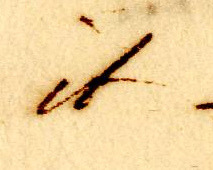it.
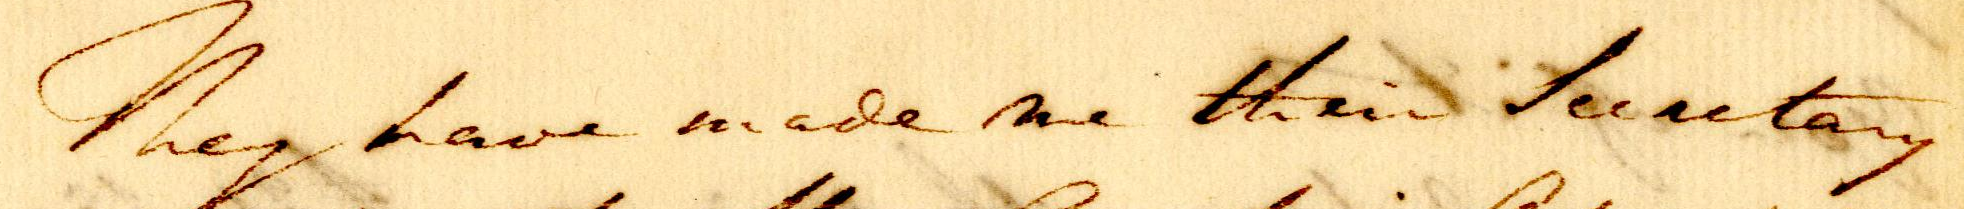They have made me their Secretary
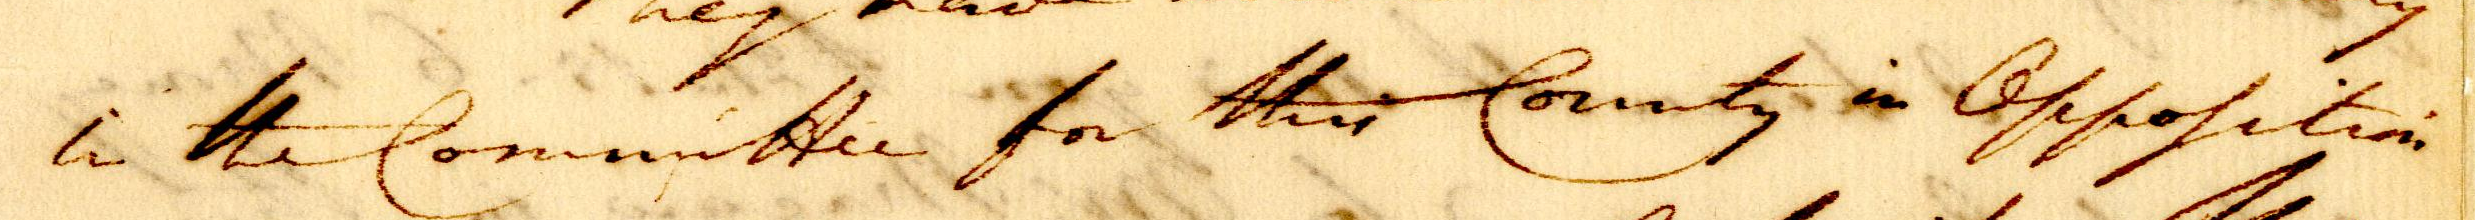in the Committee for this County in Opposition
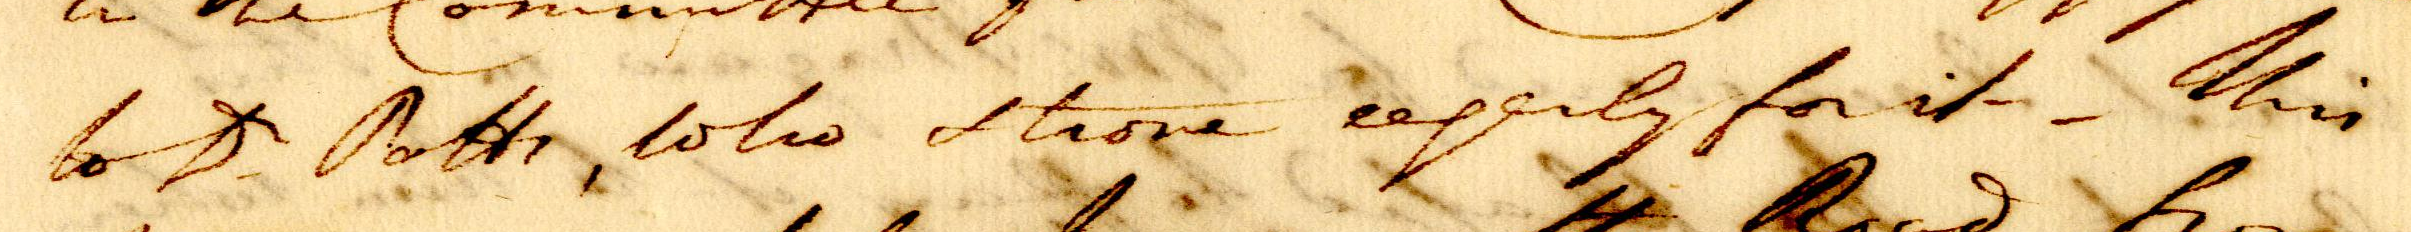to D^r Potts who strove eagerly for it. This
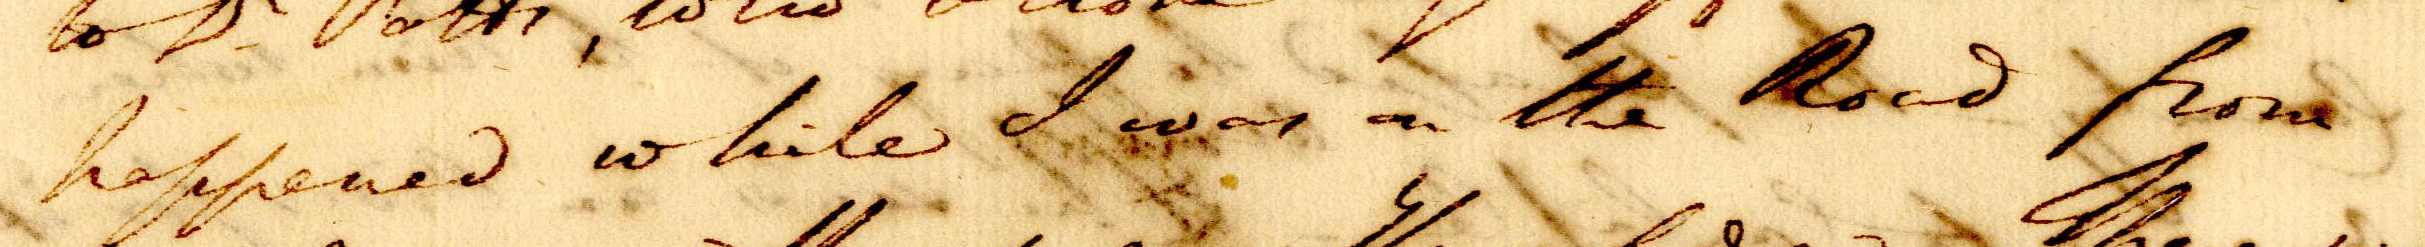happened while I was on the Road from
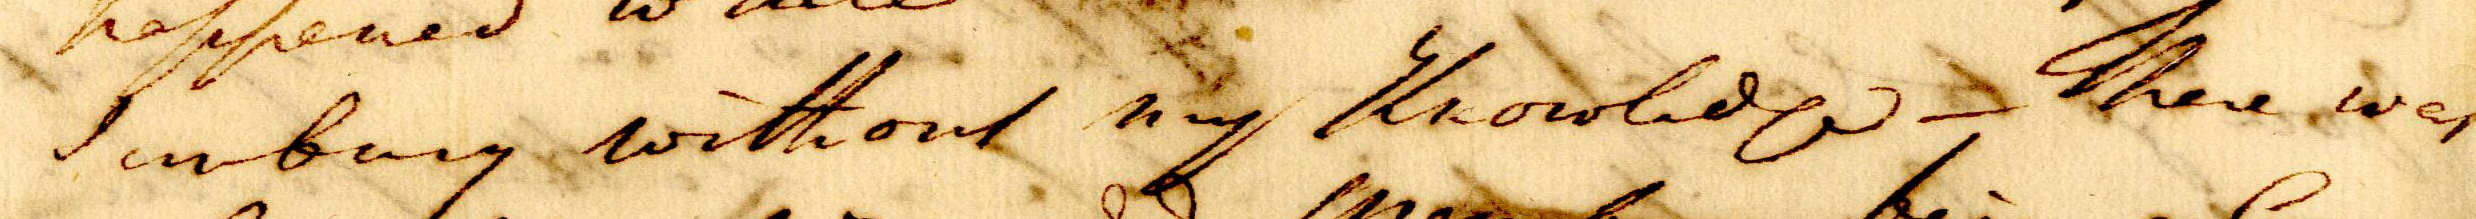Sunbury without my knowledge. There was
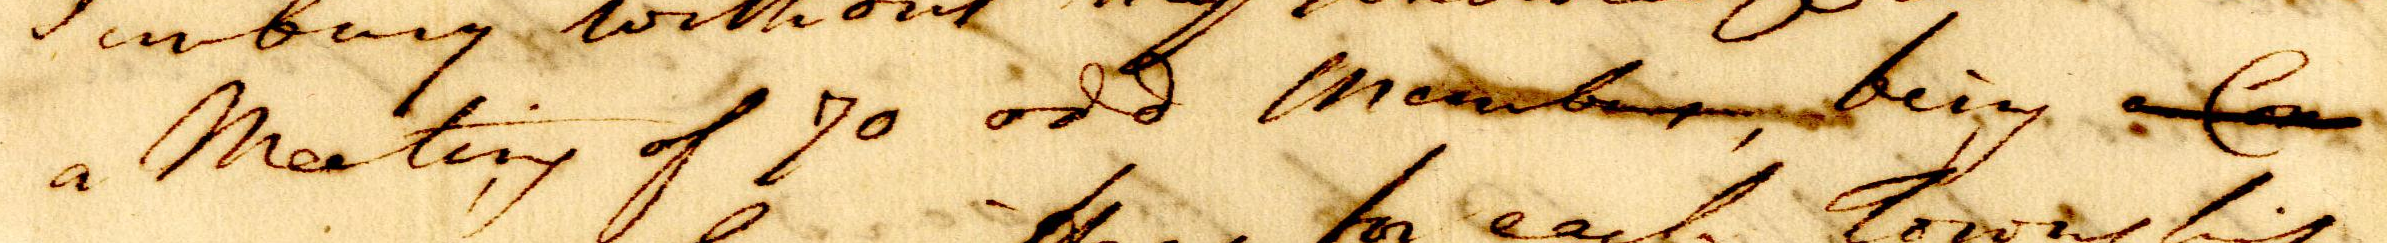a Meeting of 70 odd Members, being Con-
